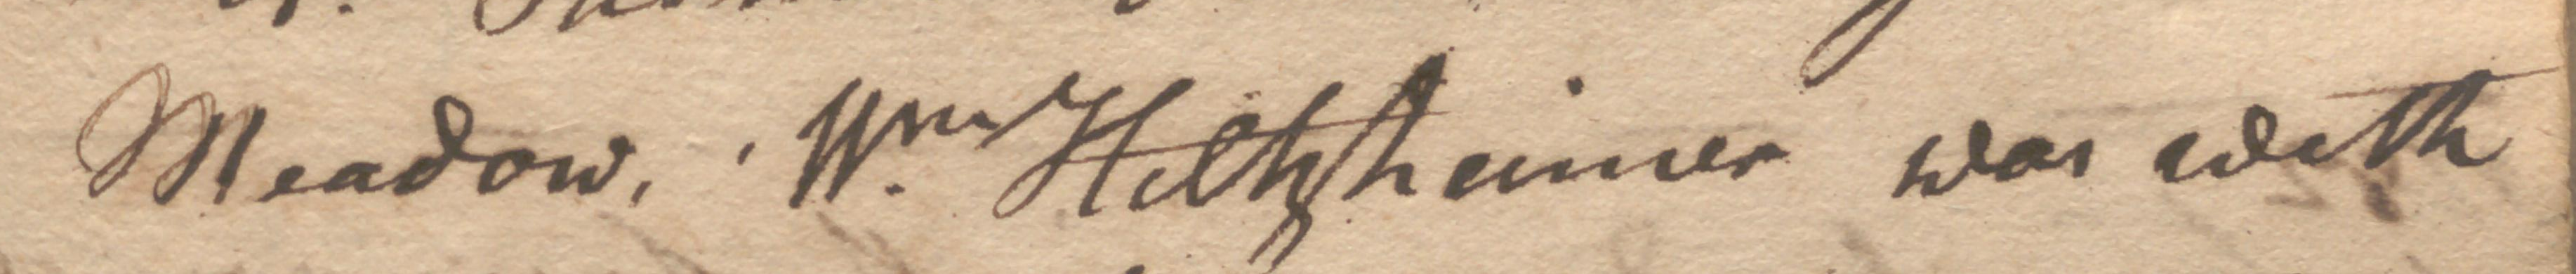Meadow. W^m. Hiltzheimer was with
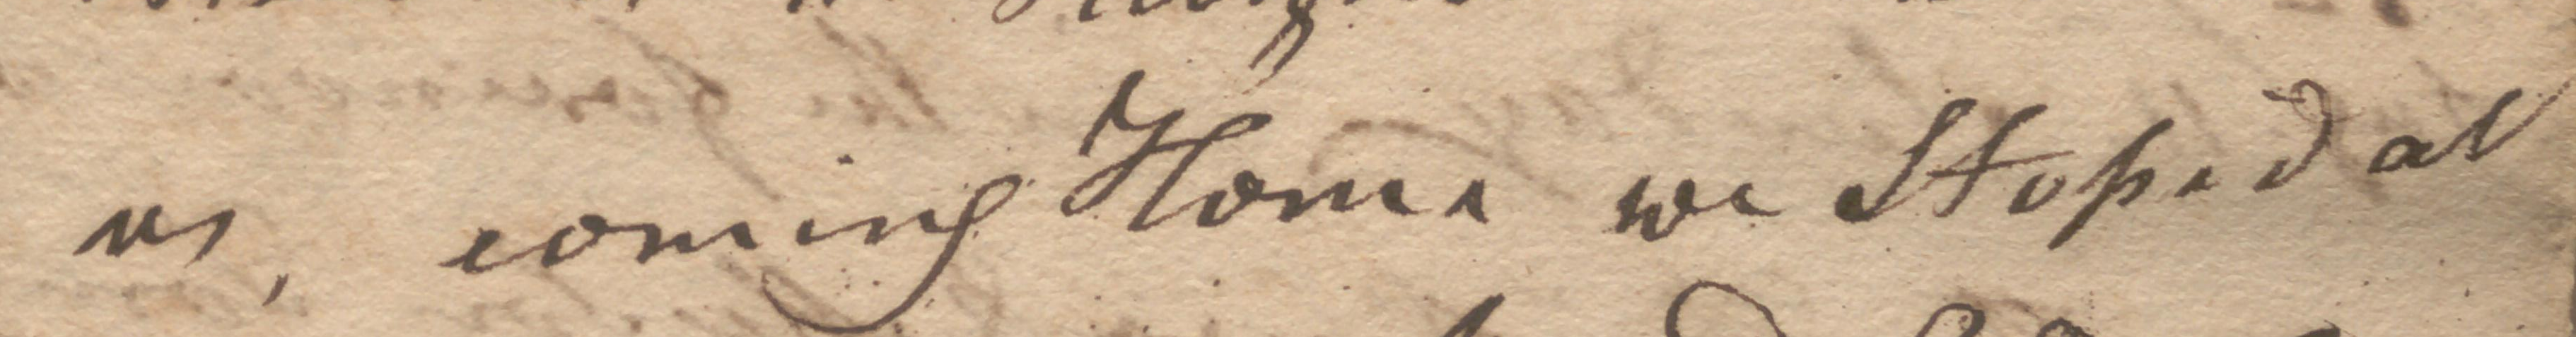us, coming Home we Stoped at
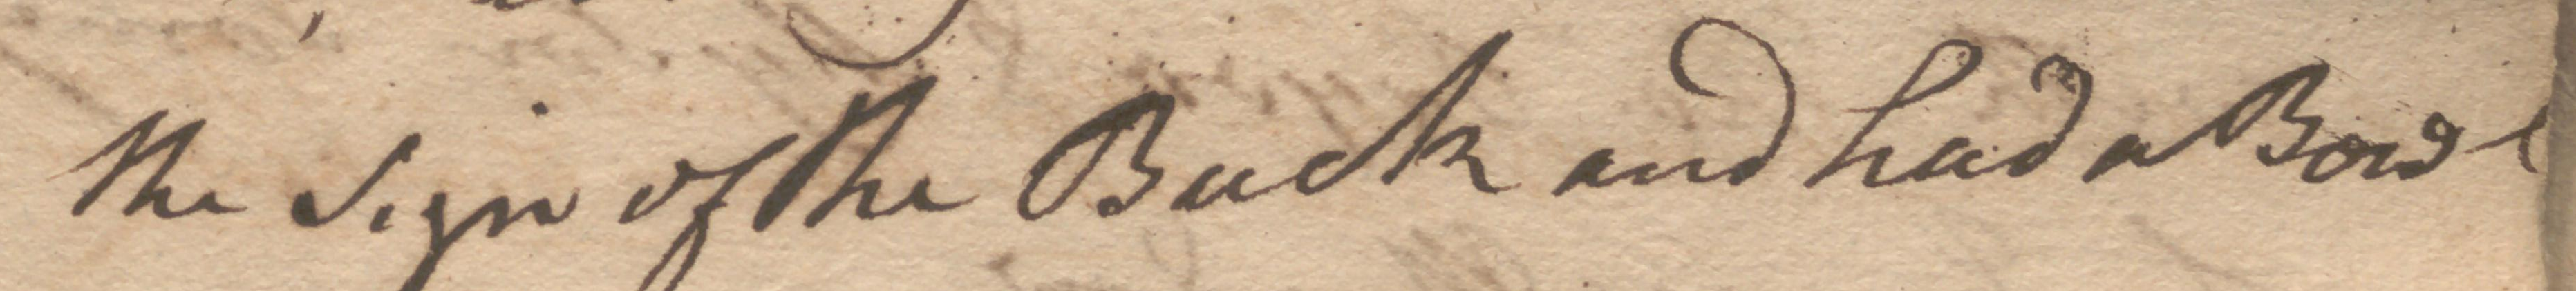the sign of the Back and had a Bowl
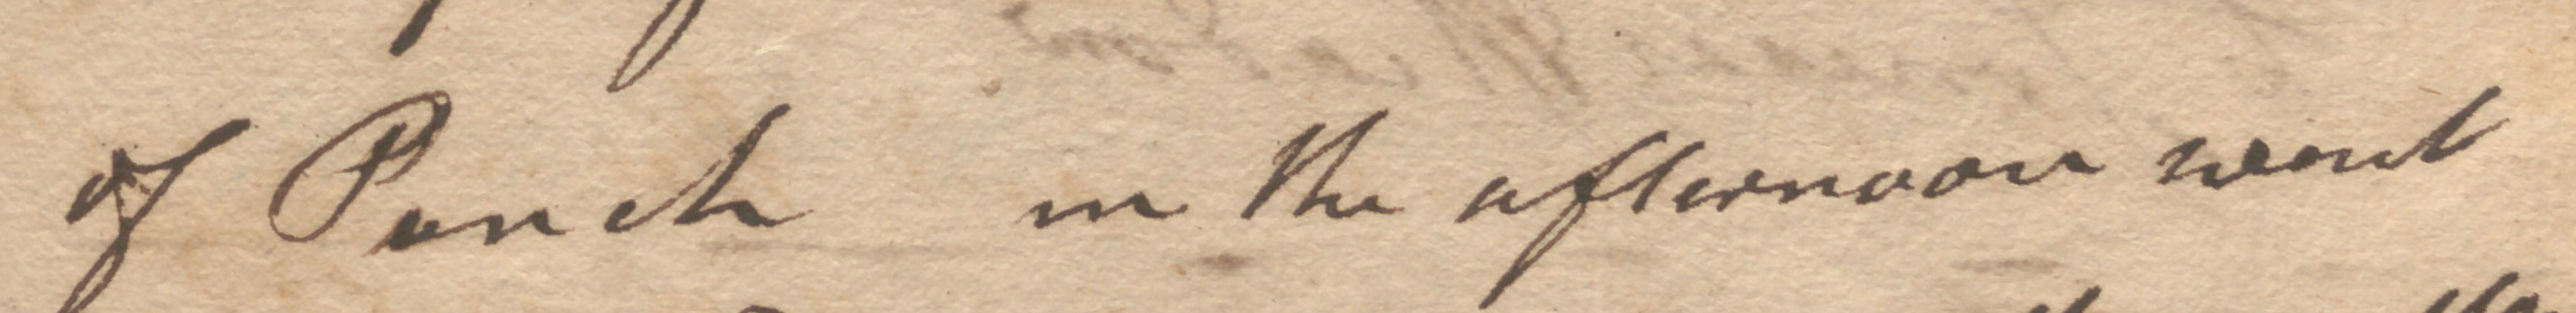of Punch in the afternoon went
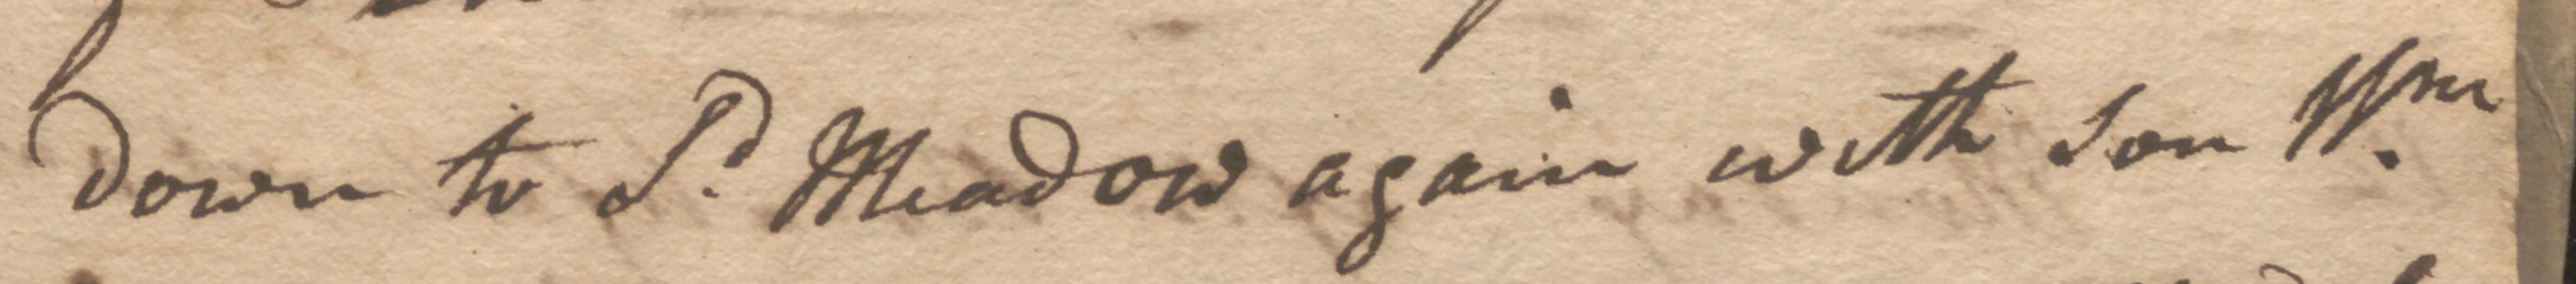down to S^d. Meadow again with son W^m.
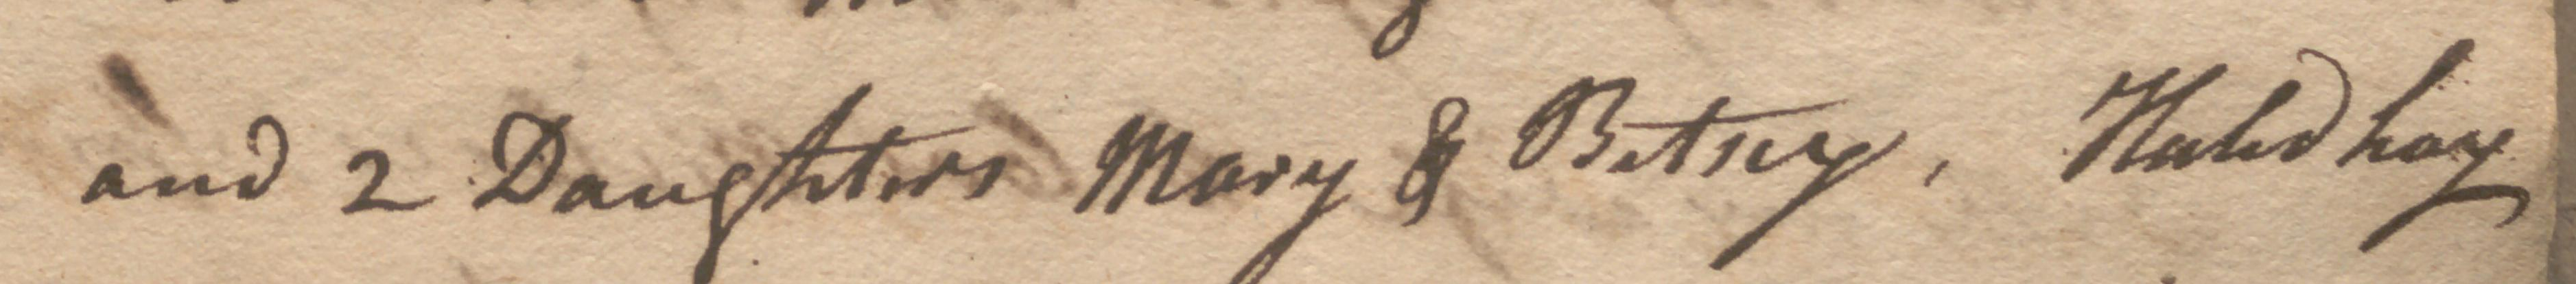and 2 Daughters Mary & Betsey. Haled hay
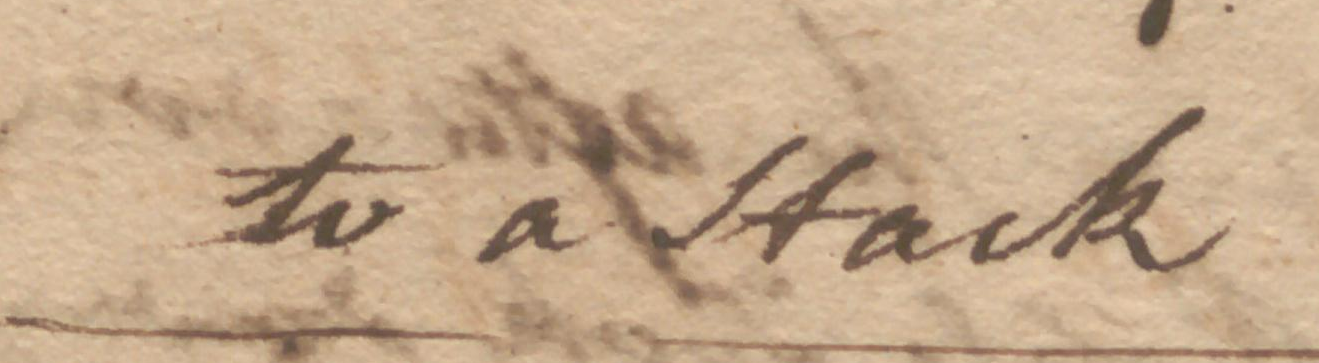to a Stack
